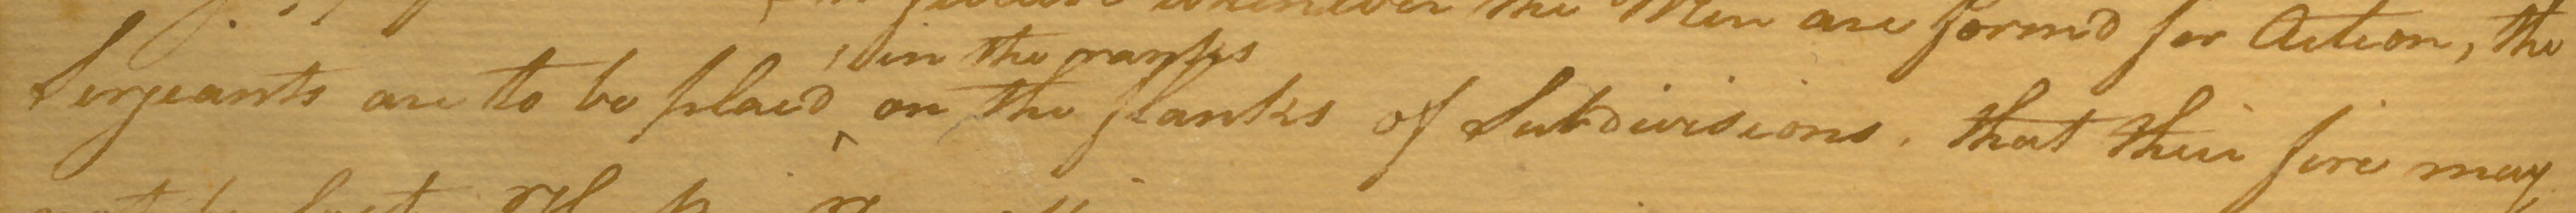Serjeants are to be plac'd ^ on the flanks of Subdivisions, that their fire may
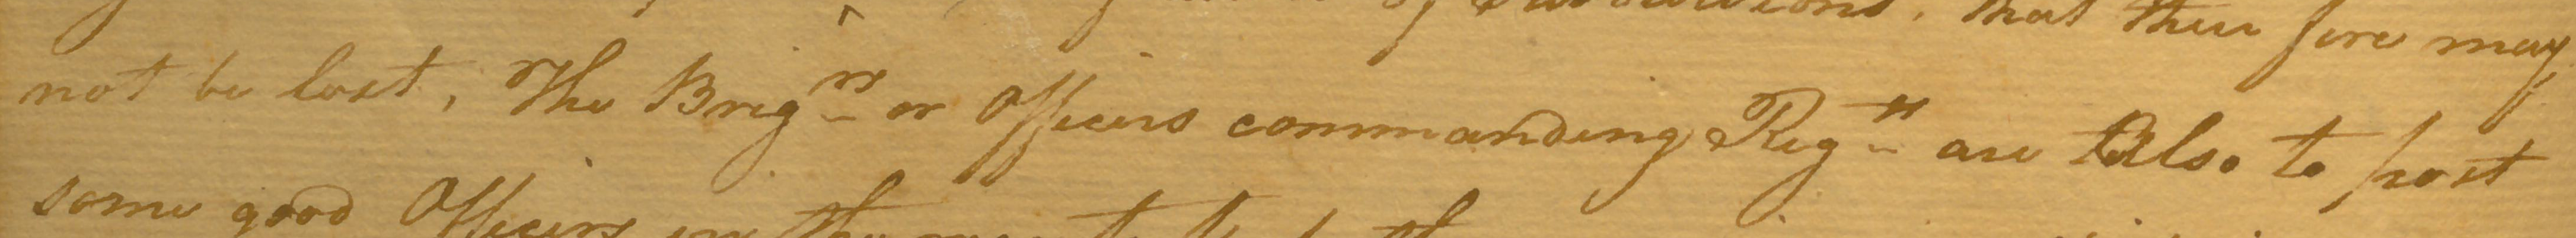not be last. The Brig^rs or Officers commanding Reg^ts. are Also to post
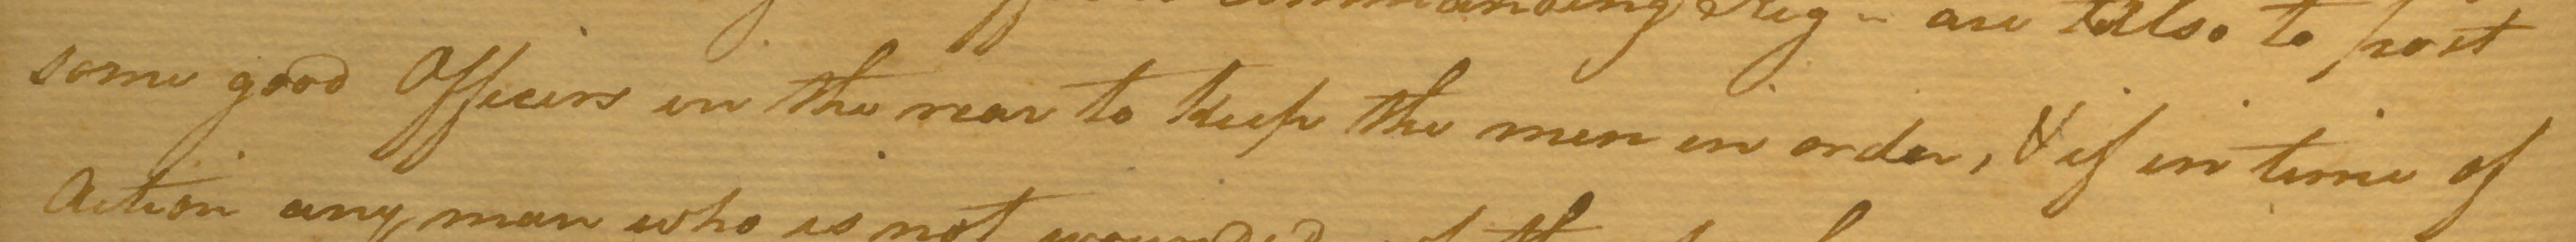some good Officers in the rear to keep the men in order, & if in time of
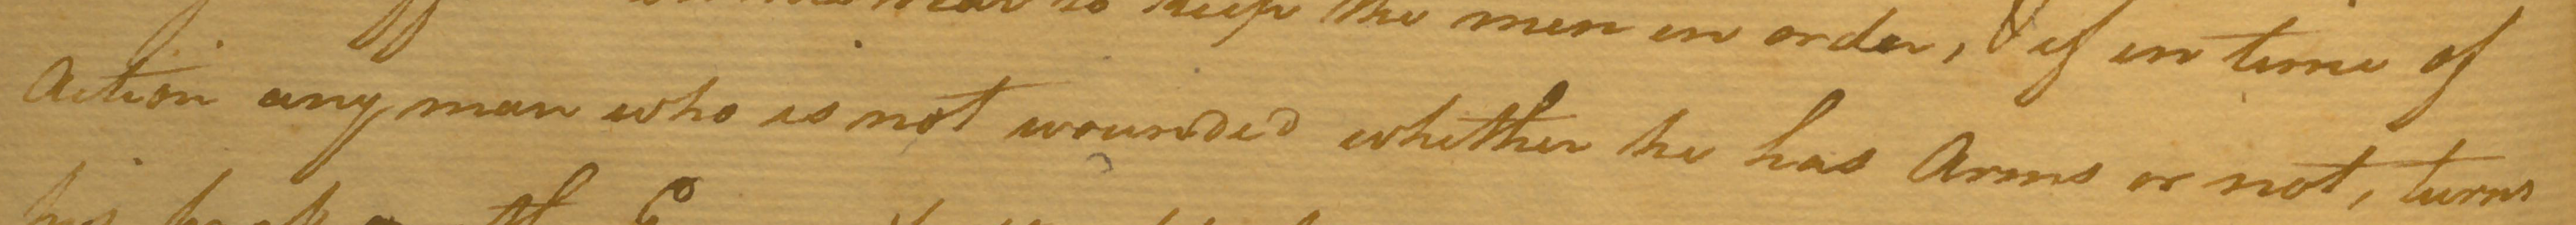Action any man who is not wounded whether he has Arms or not, turn
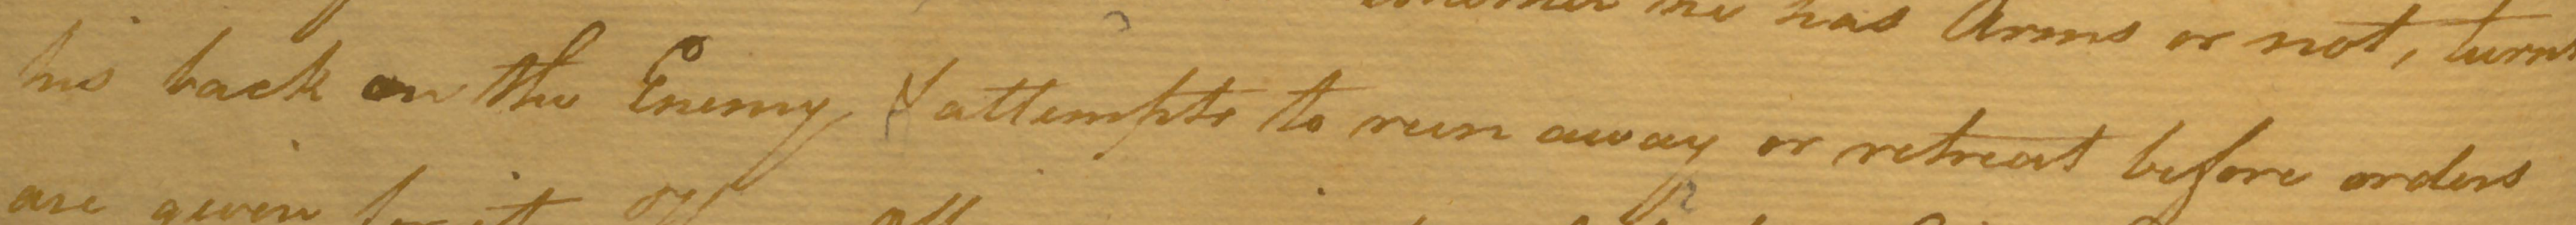his back on the Enemy & attempt to run away or retreat before orders
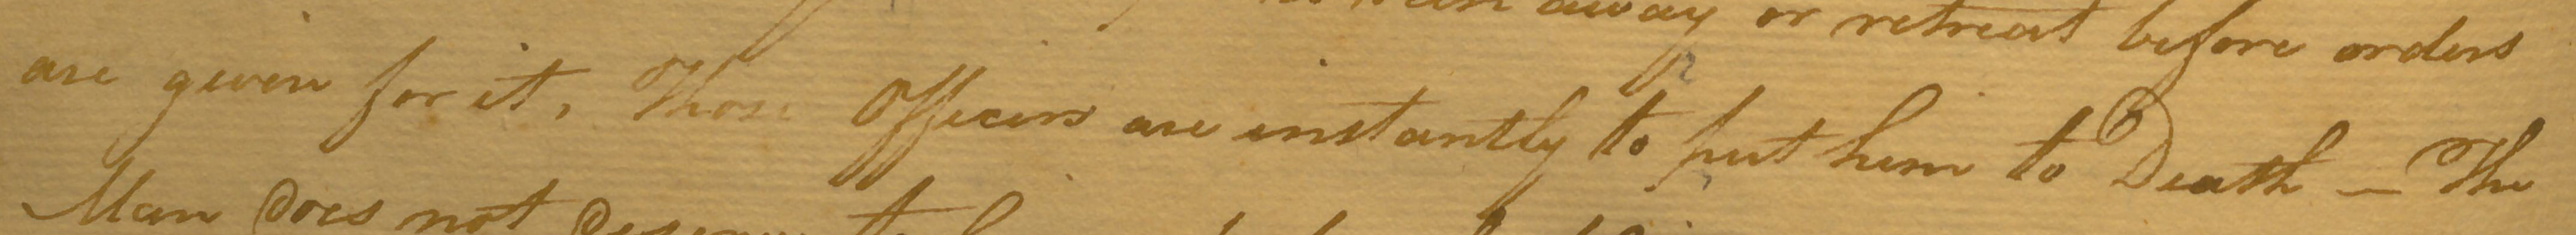are given for it. Those Officers are instantly to put him to Death- The
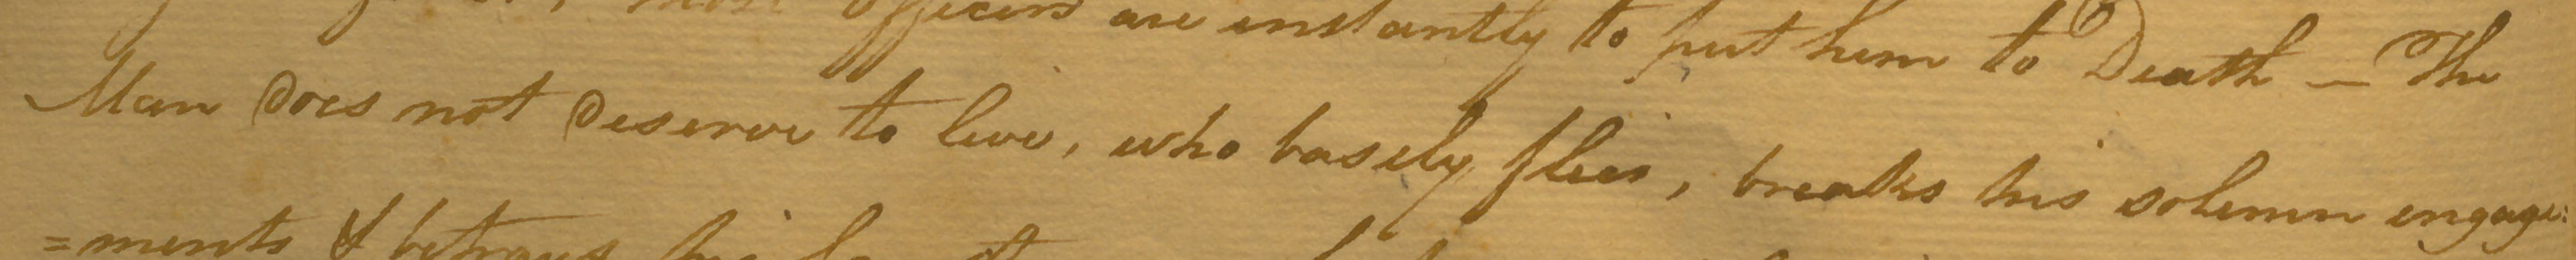Man does not desire to live, who Lasily flies, breaks his solmen engage-
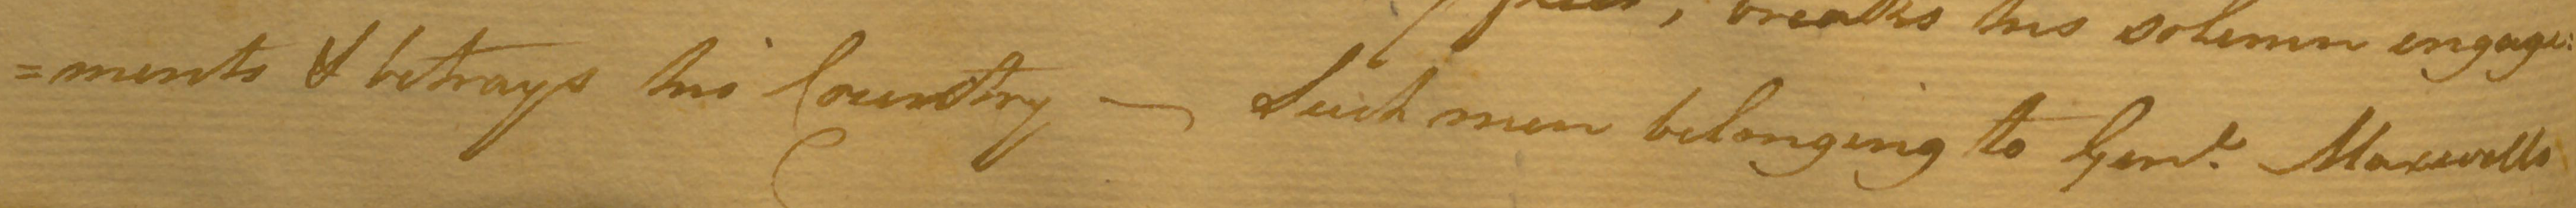-ments & betrays his Country- such man belonging to Gen^l. Maxwells
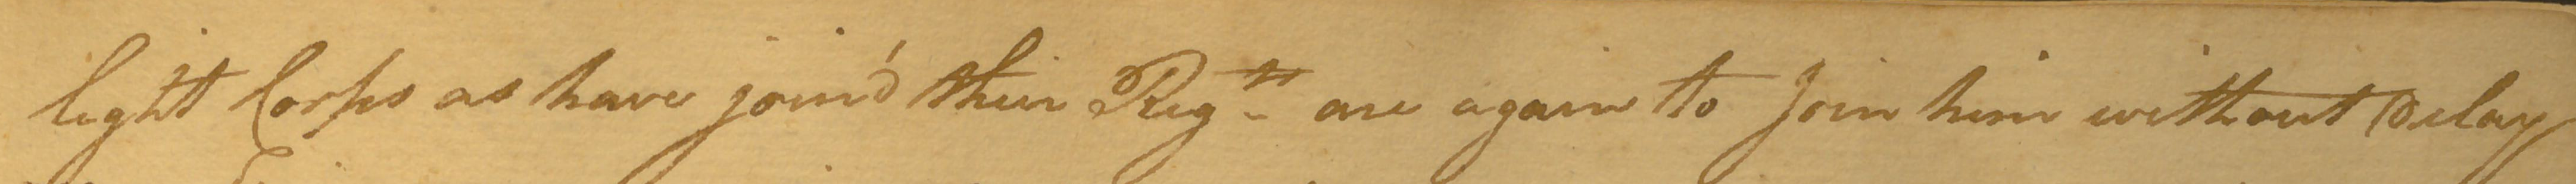light Corps as have join'd their Reg^ts are again to Join him without delay
